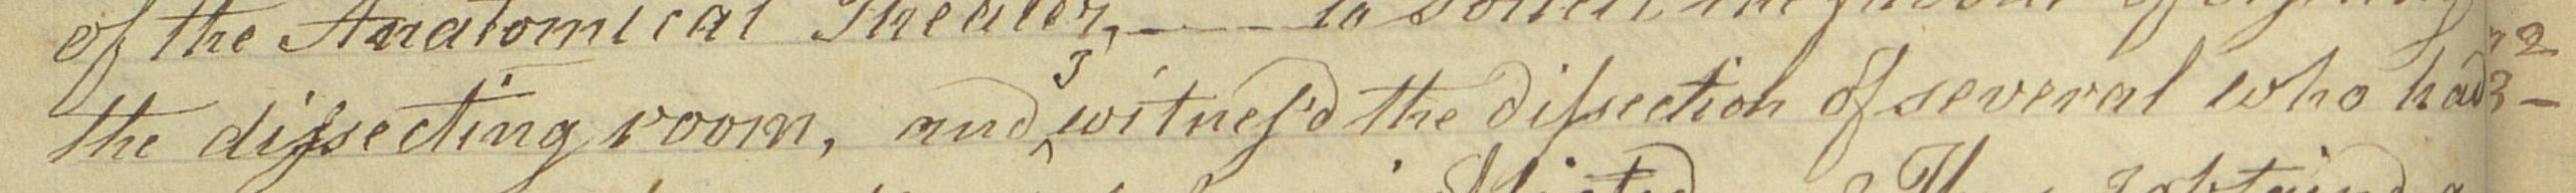the dissecting room, and ^ witnes'd the dissection of several who had
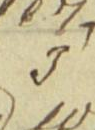I
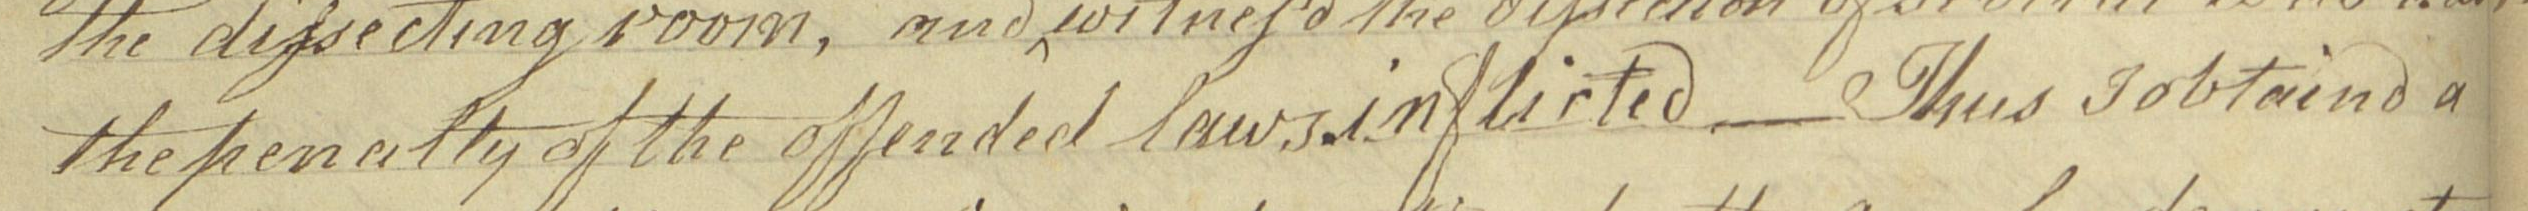the penalty of the offended laws inflicted- Thus I obtaind a
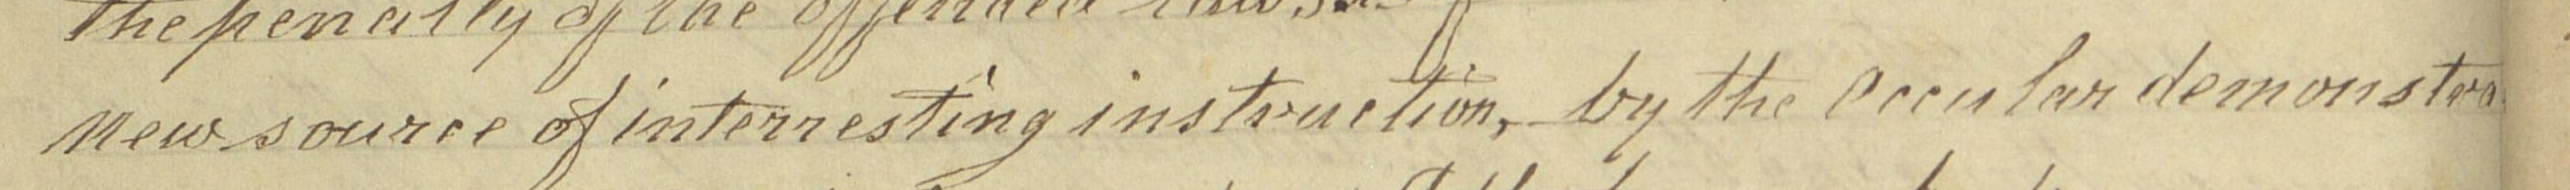new source of interresting instruction, by the Occular demonstra-
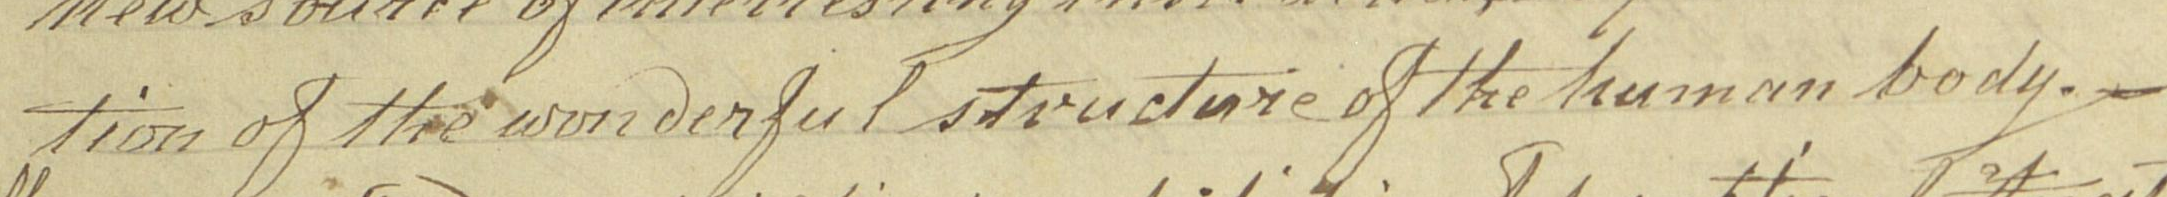-tion of the wonderful structure of the human body.
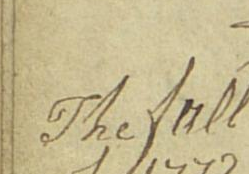The fall
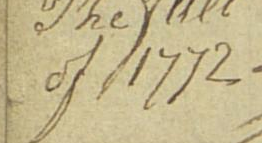of 1772
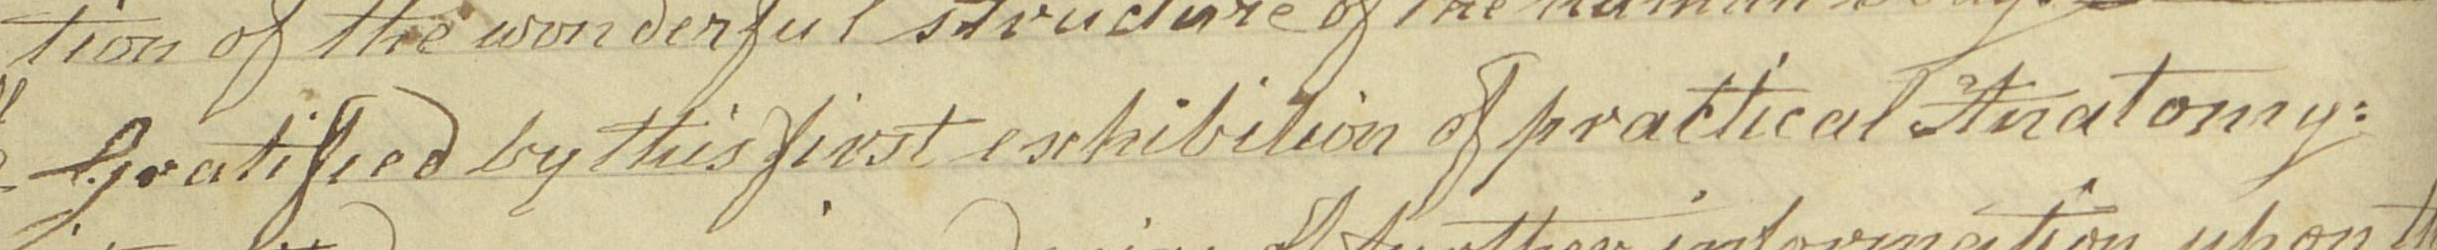Gratified by this first exhibition of practical Anatomy:
